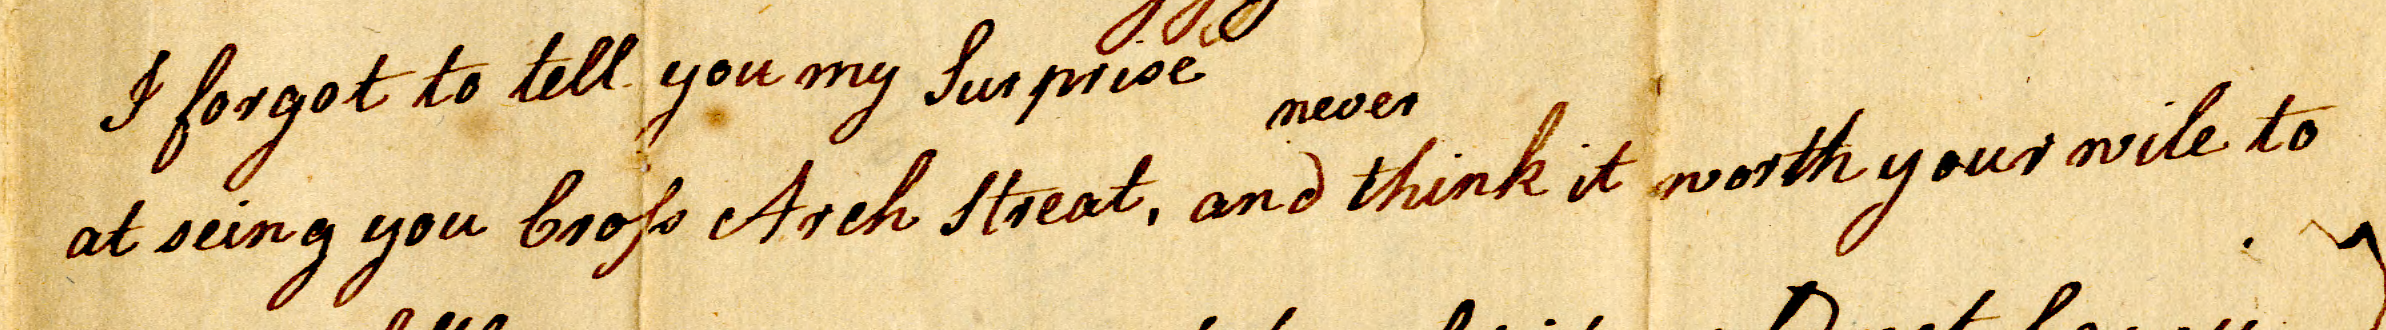at seeing you Cross Arch Streat, and think it worth your wile to
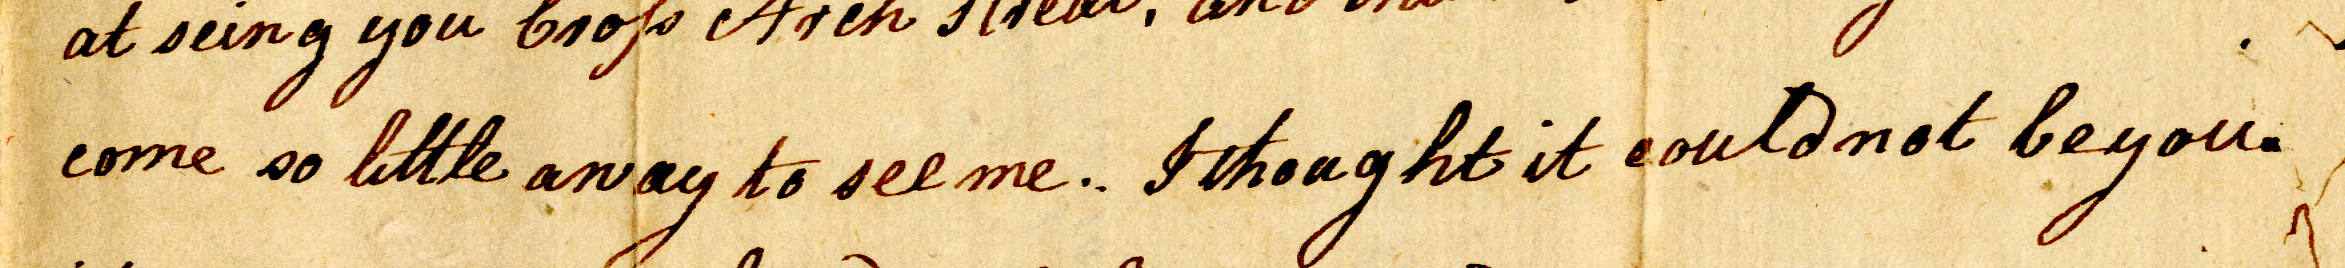come so little away to see me. I thought it could not be you
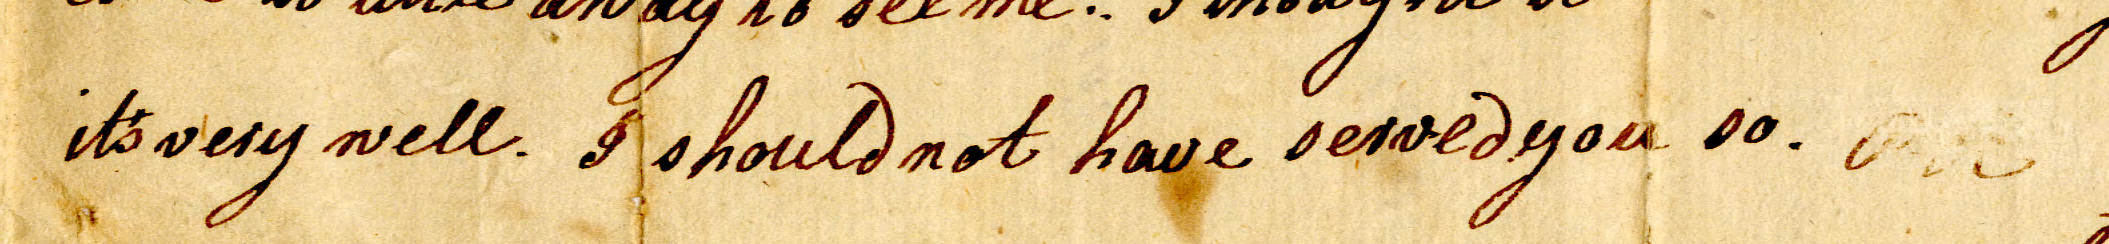its very well. I should not have served you so. [PR]
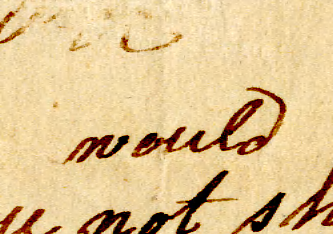would
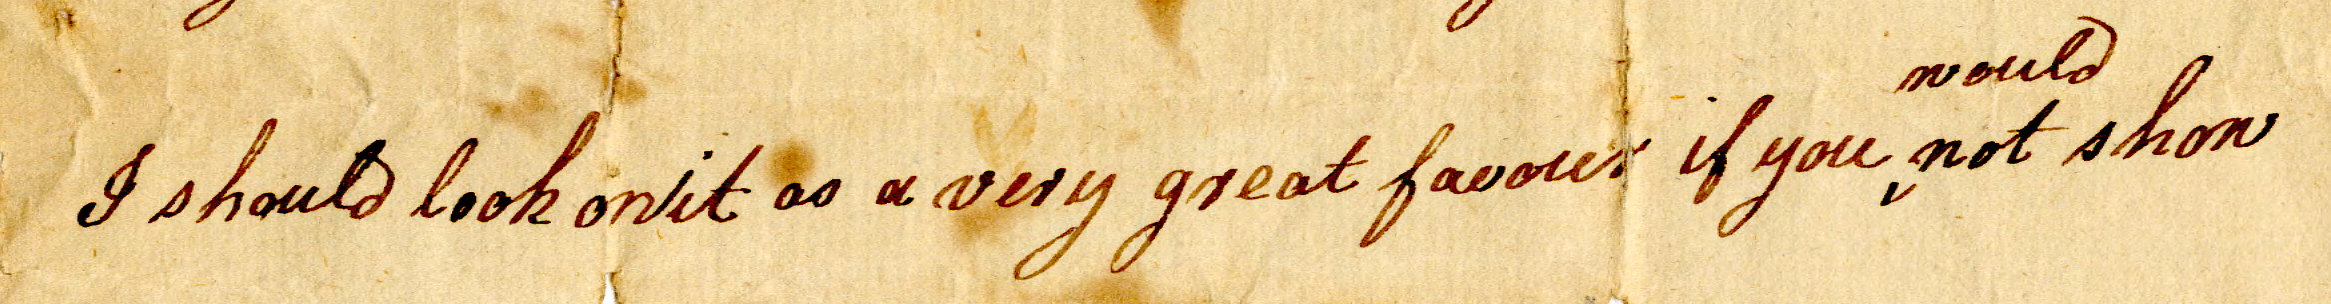I should look onit as a very great favour if you ^ not show
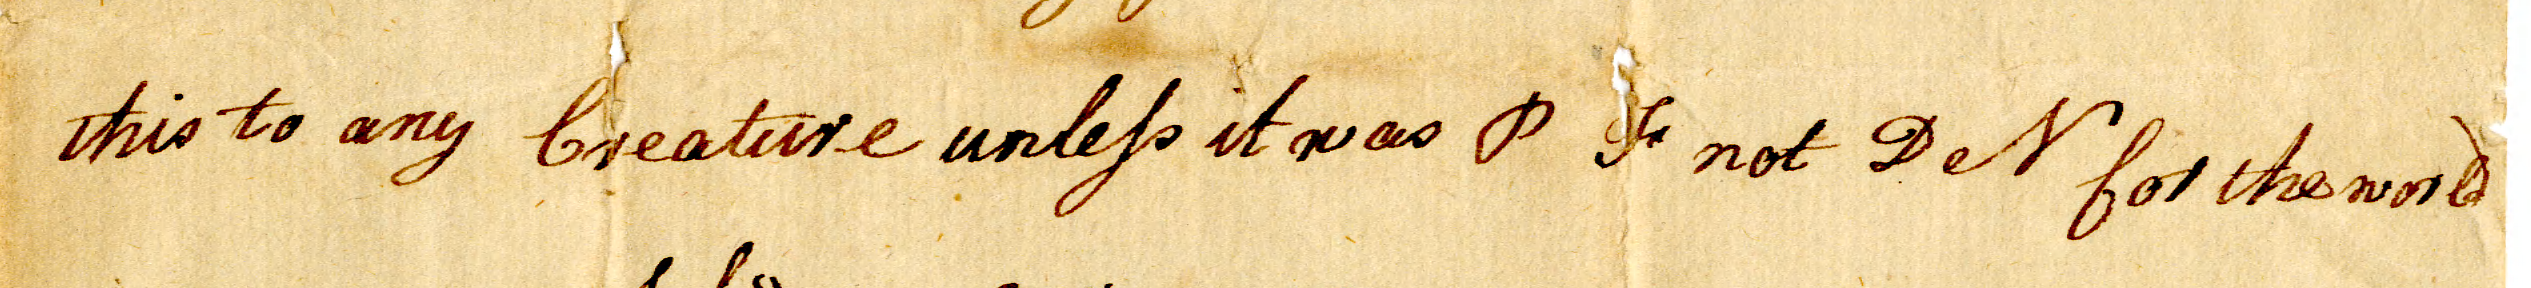this to any Creature unless it was PF not DN for the world
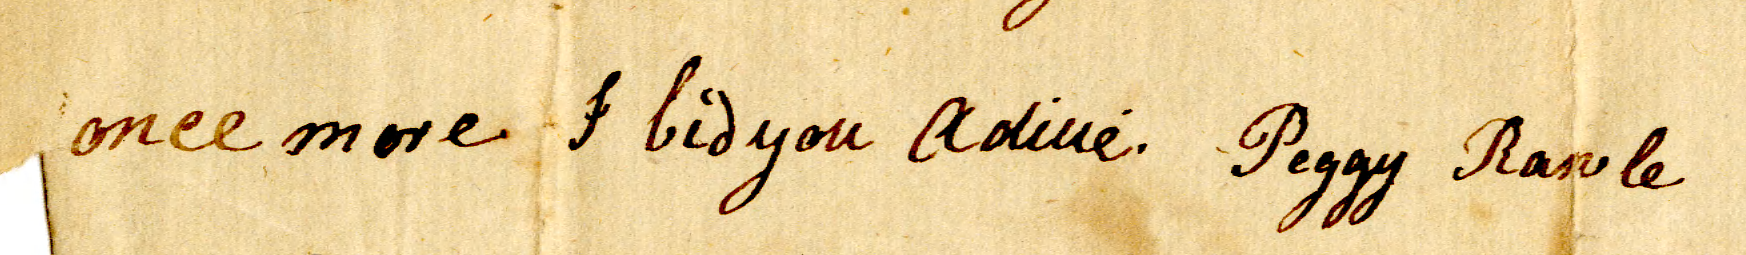once more I bid you Adiue. Peggy Rawle
